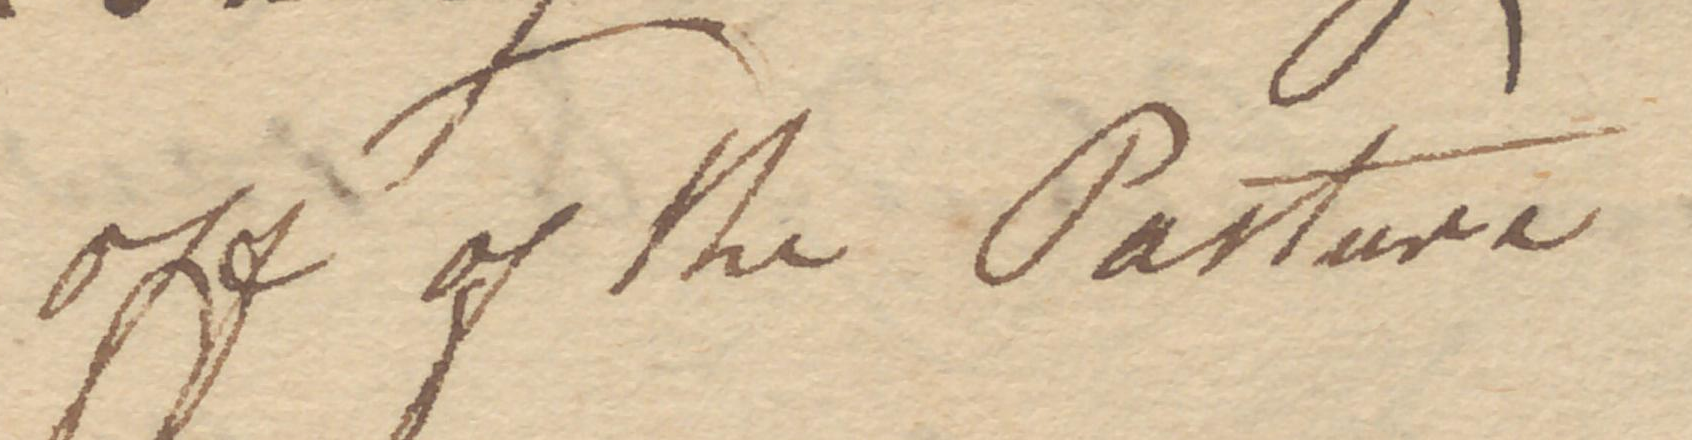off of the Pasture
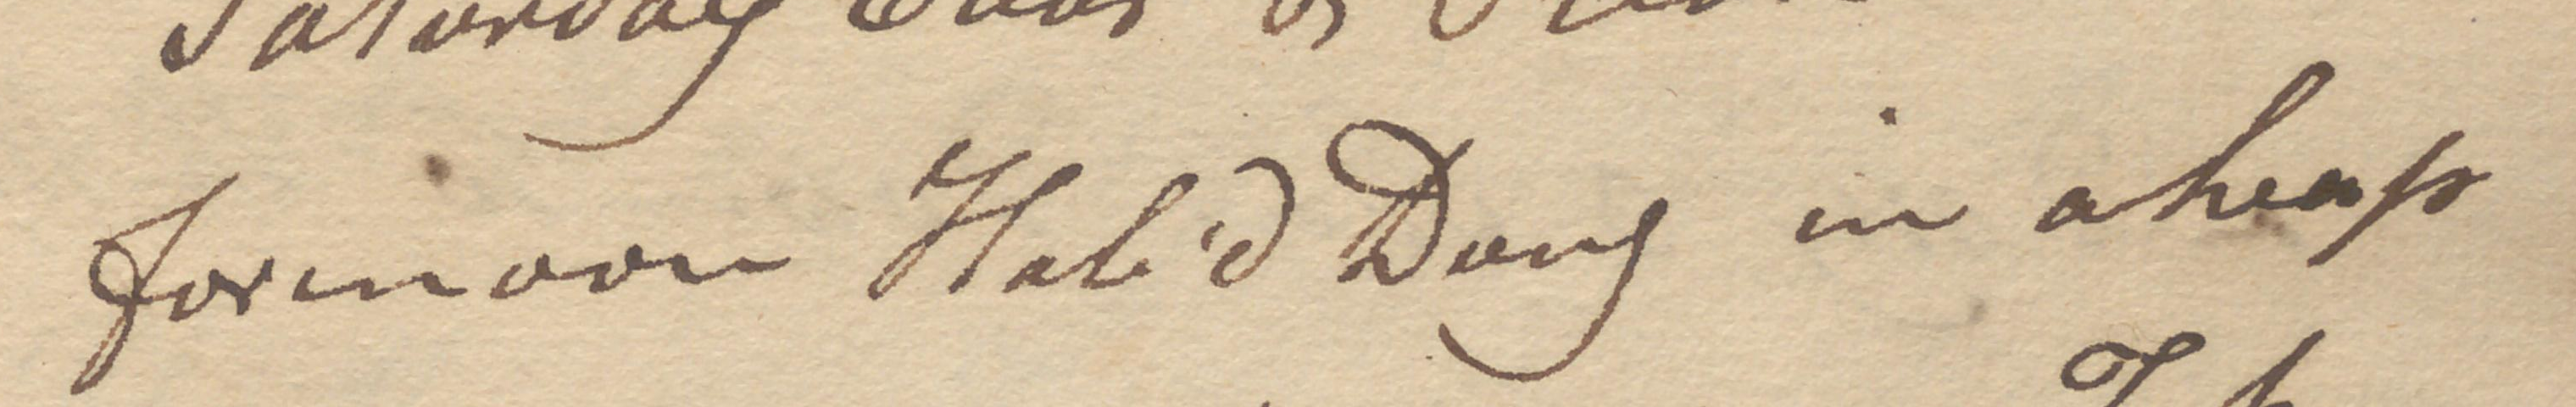forenoon Hal'd Dung in a heap
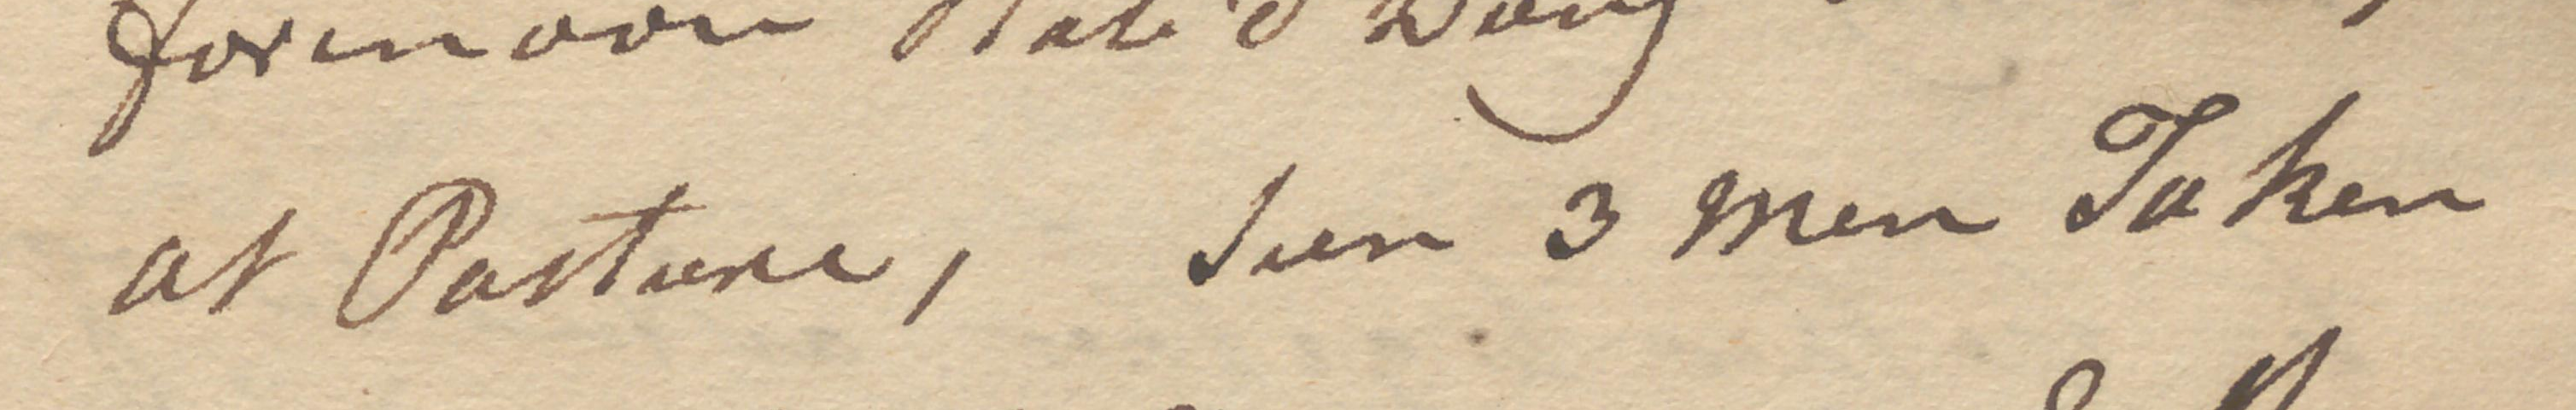at Pasture, Seen 3 men Taken
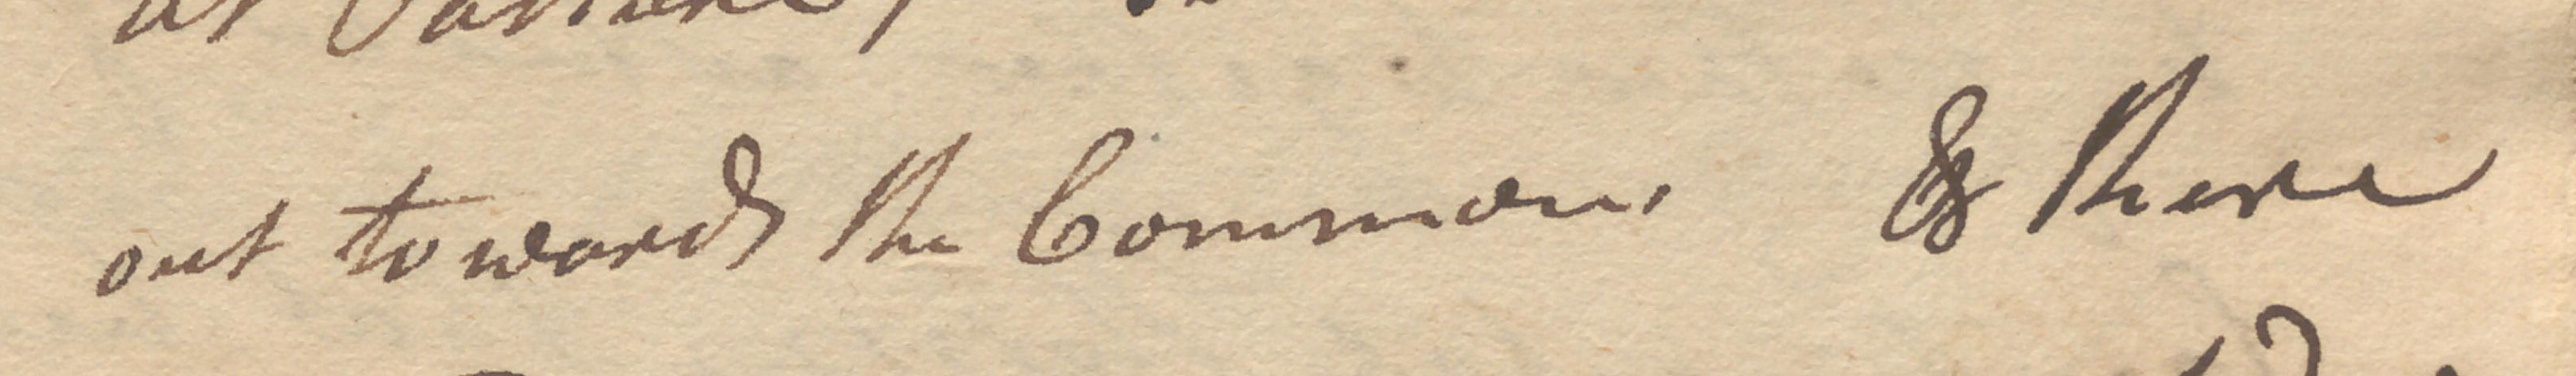out towards the Commons & there
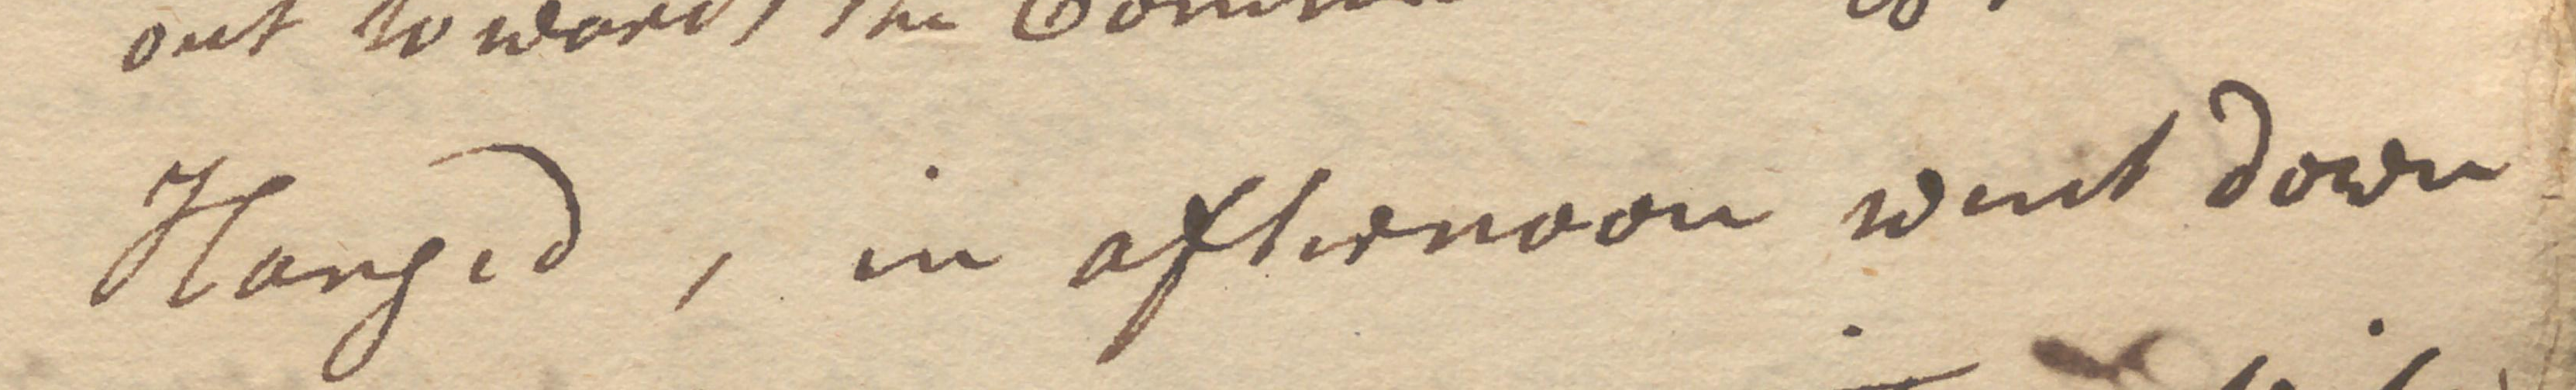Hanged, in afternoon went down
